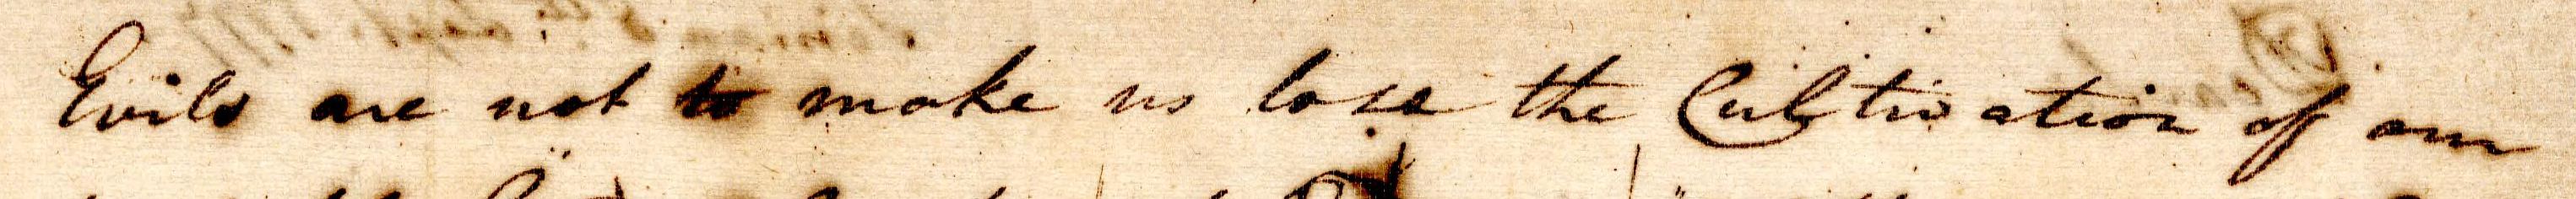Evils are not to make us lose the Cultivation of our
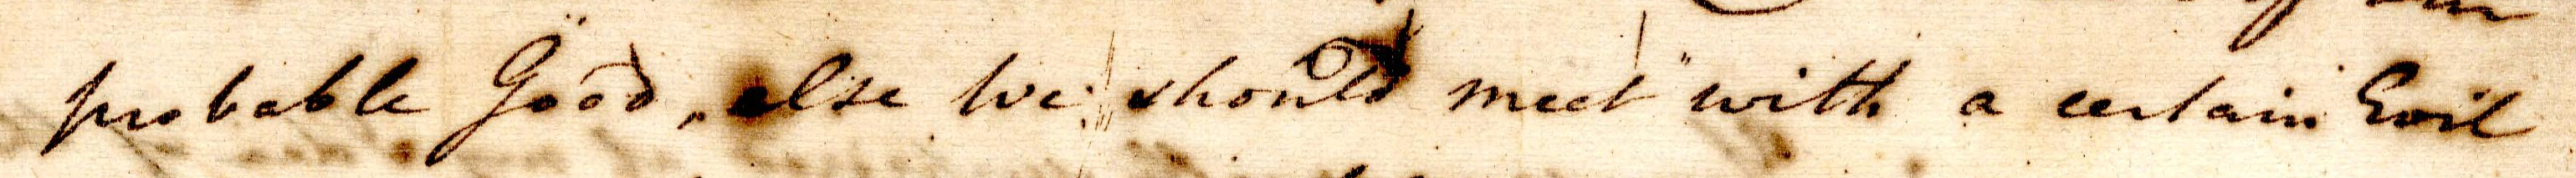probable Good, else we should meet with a certain Evil
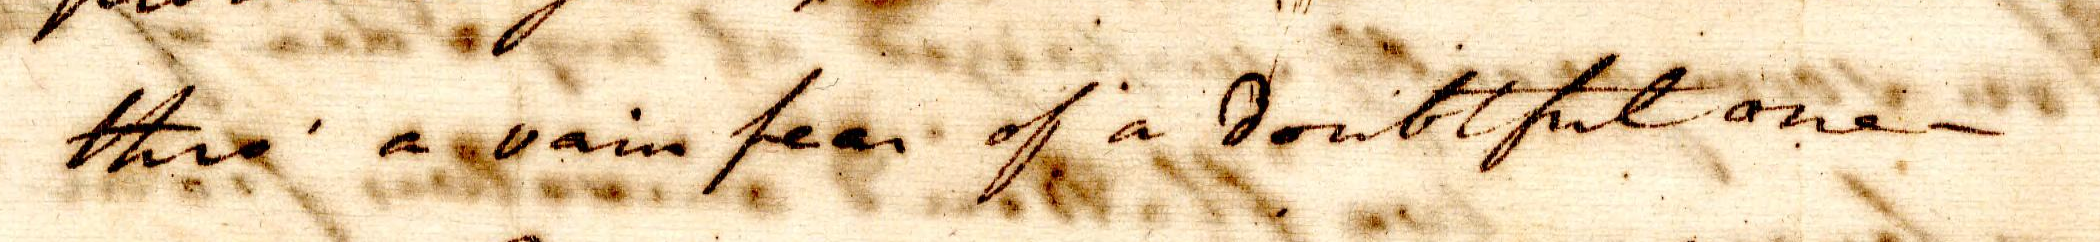this a vain fear of a doubtful one-
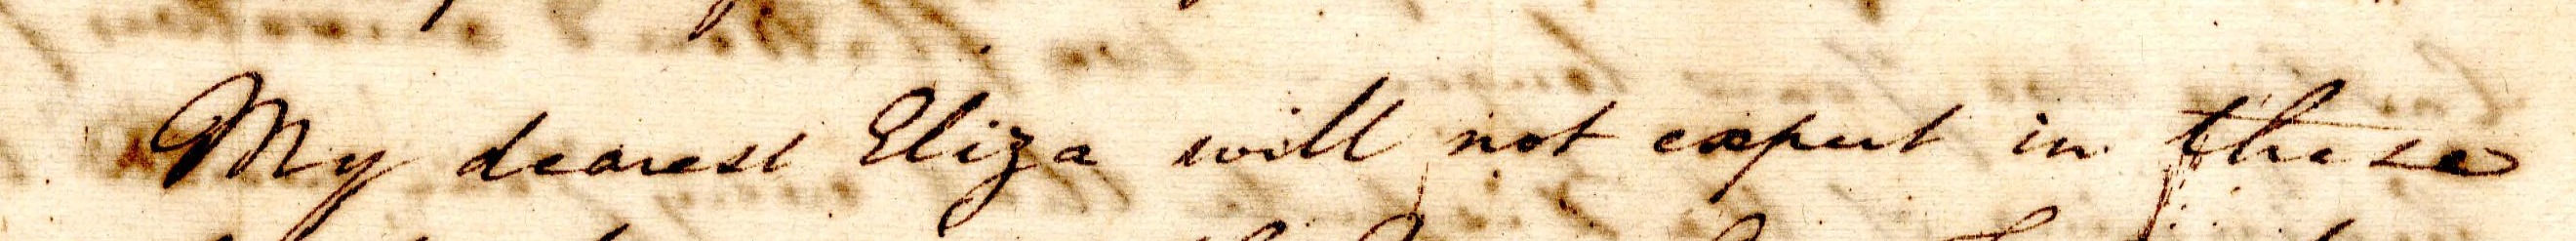My dearest Eliza will not expect in these
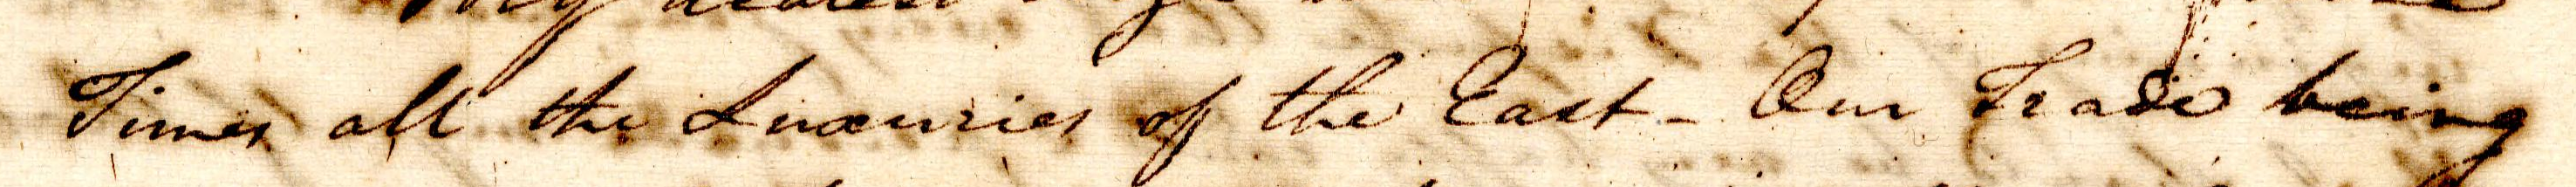Times all the Luxuries of the East- Our Trade being
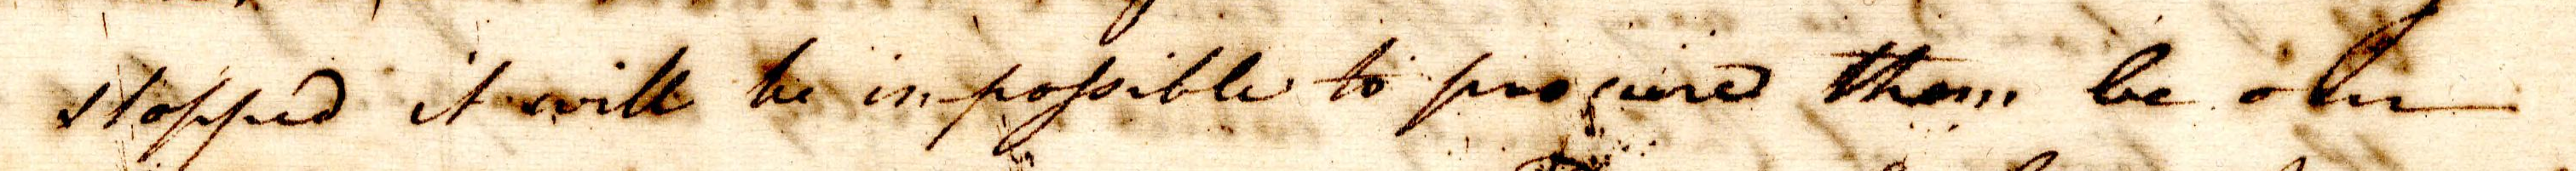stopped it will be impossible to procure them be our
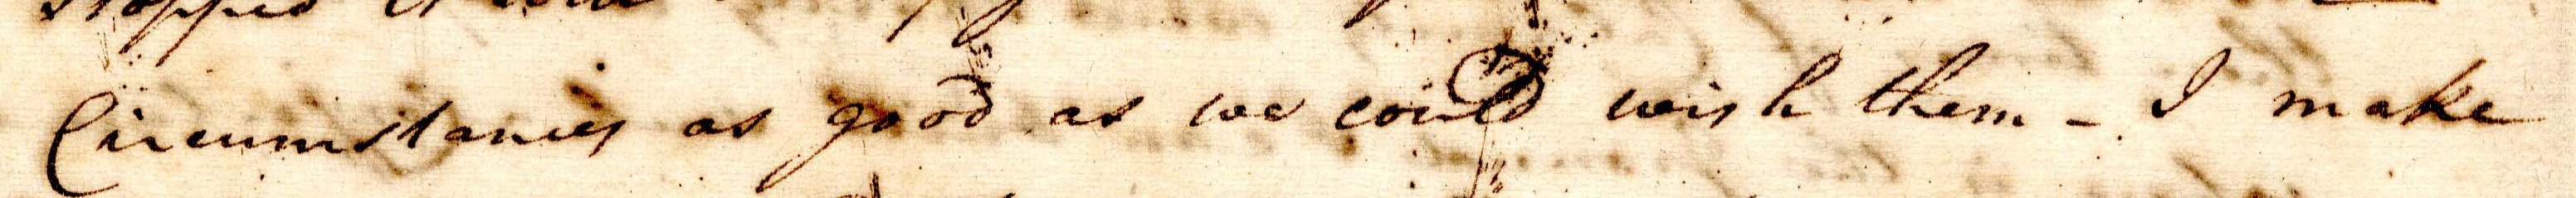Circumstances as good as we could wish them- I make
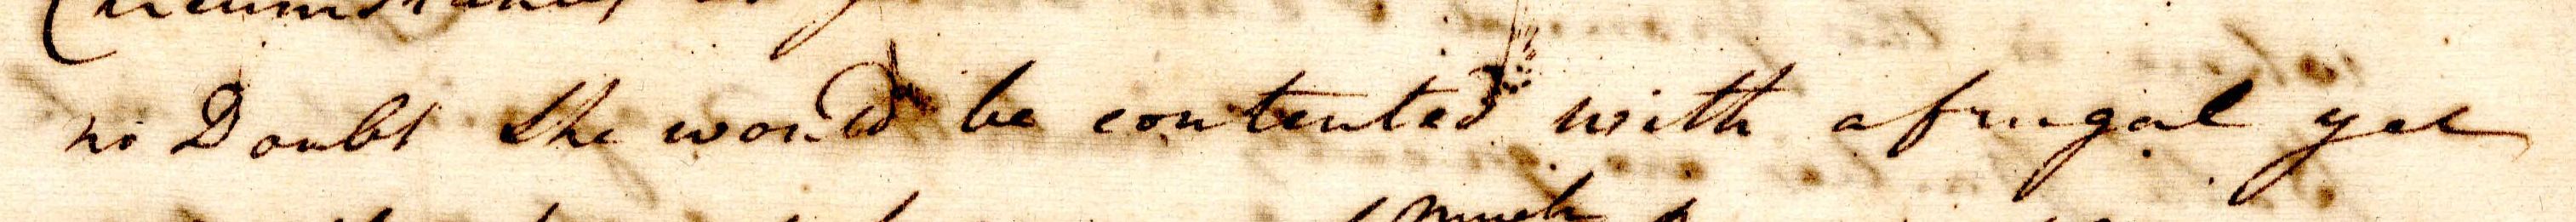no Doubt she would be contented with a frugal yet
